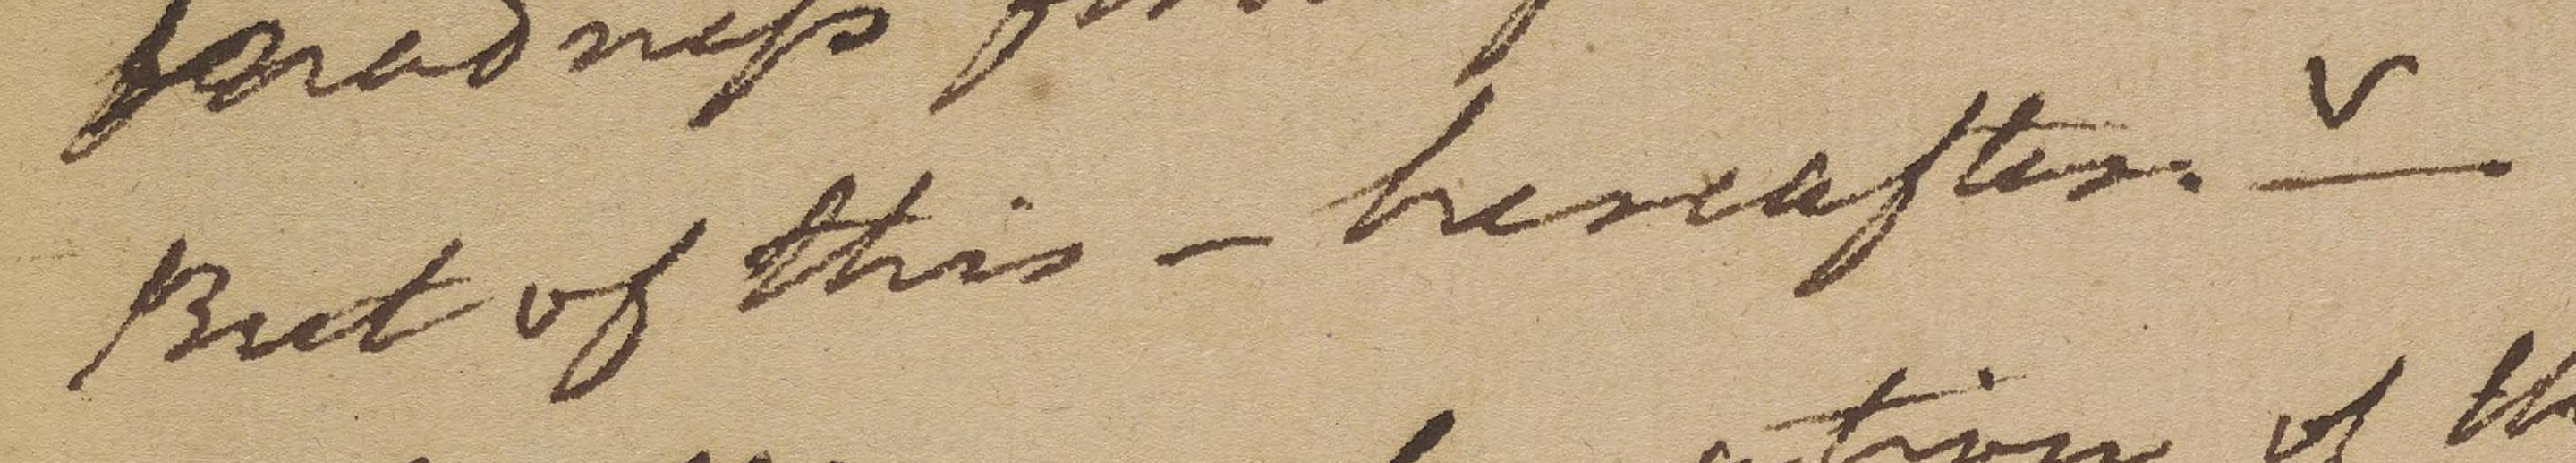But of this, hereafter. V
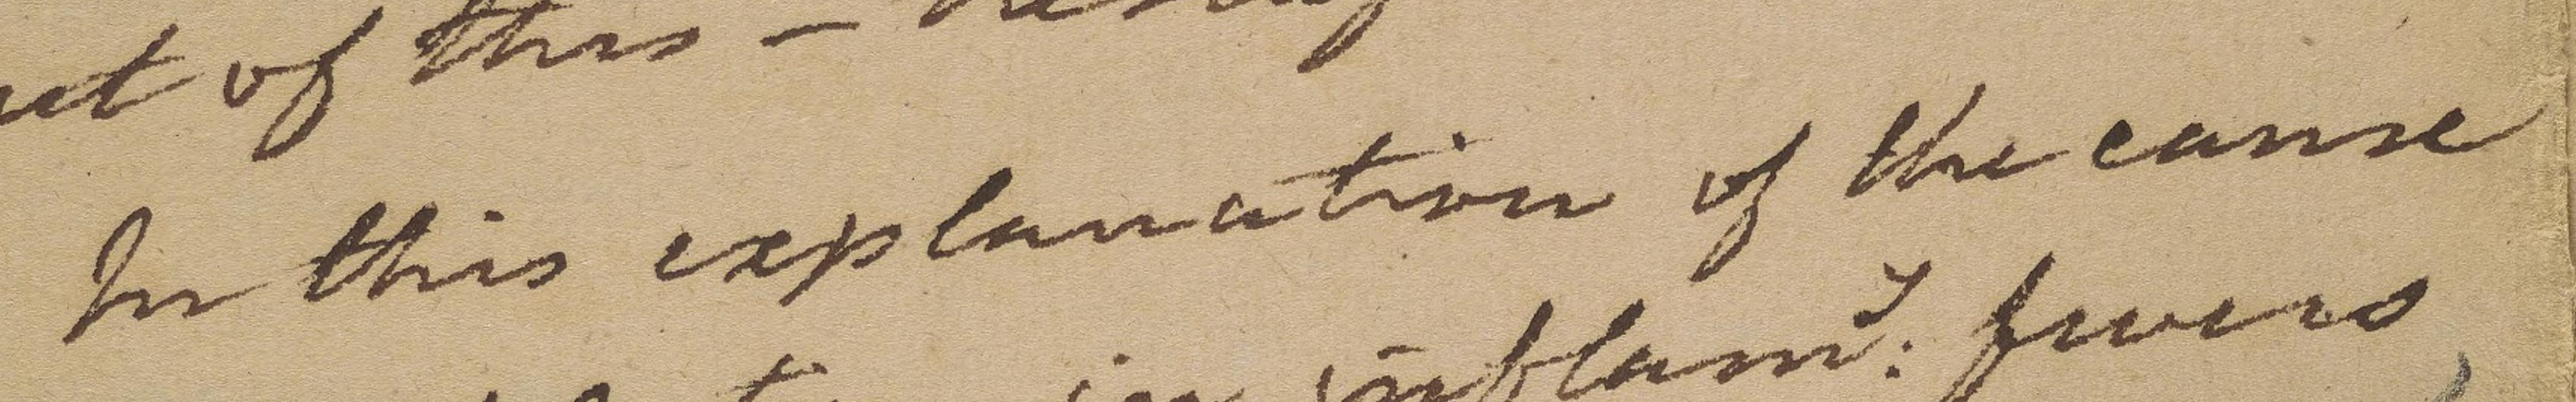In this explanation of the cause
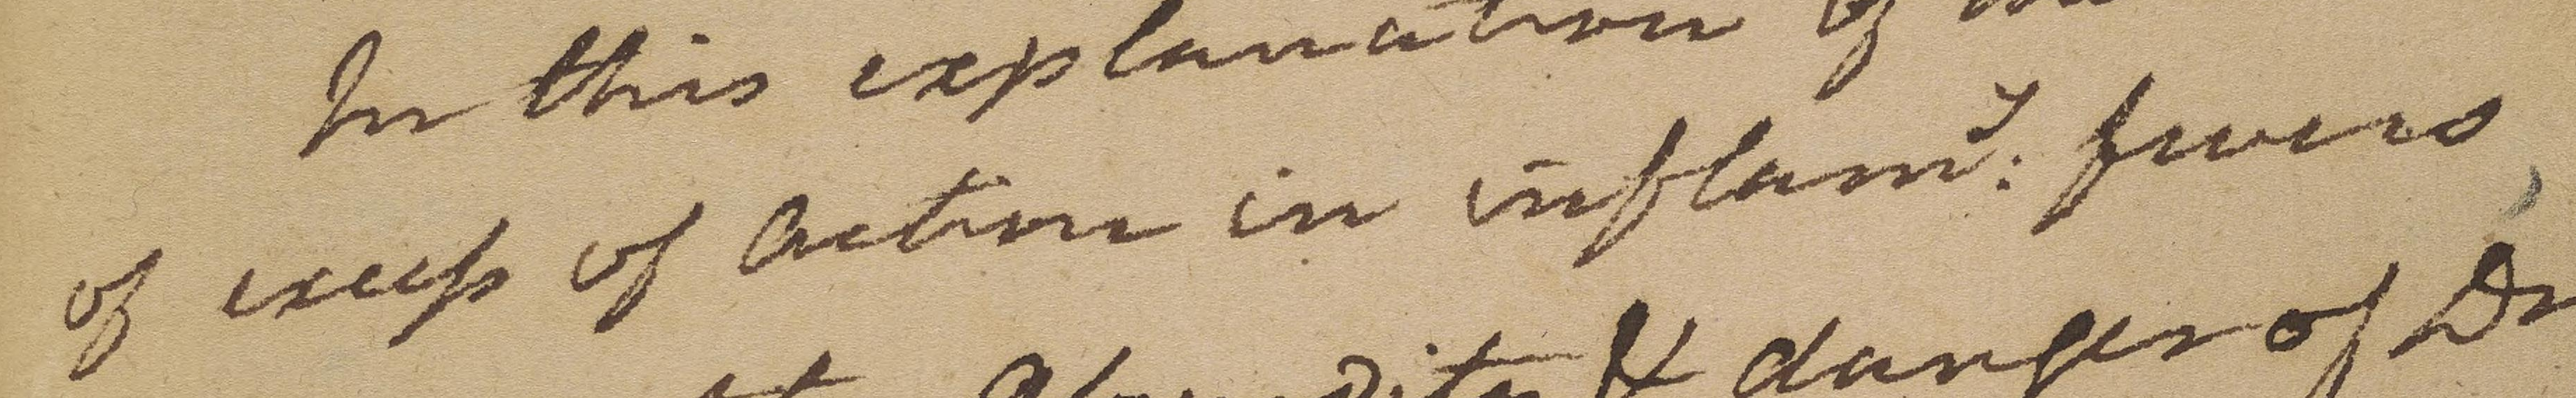of excess of action in inflam^y fevers
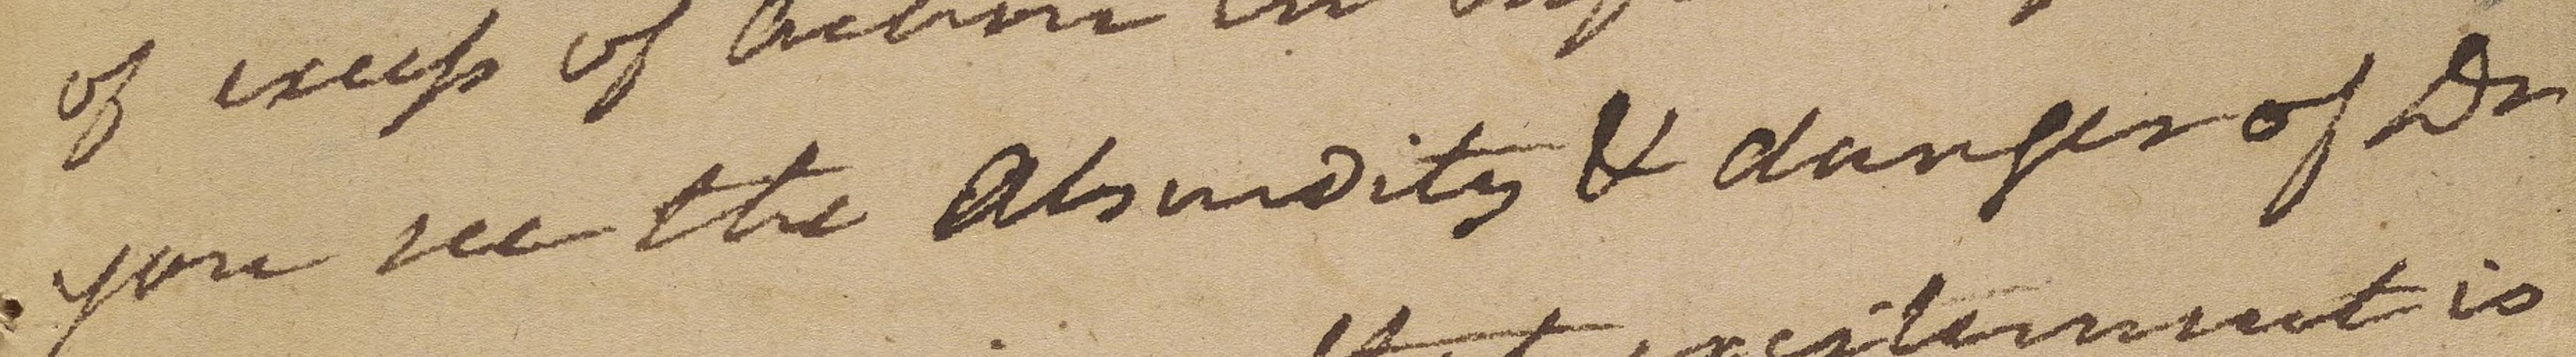you see the Absurdity & danger of D^r
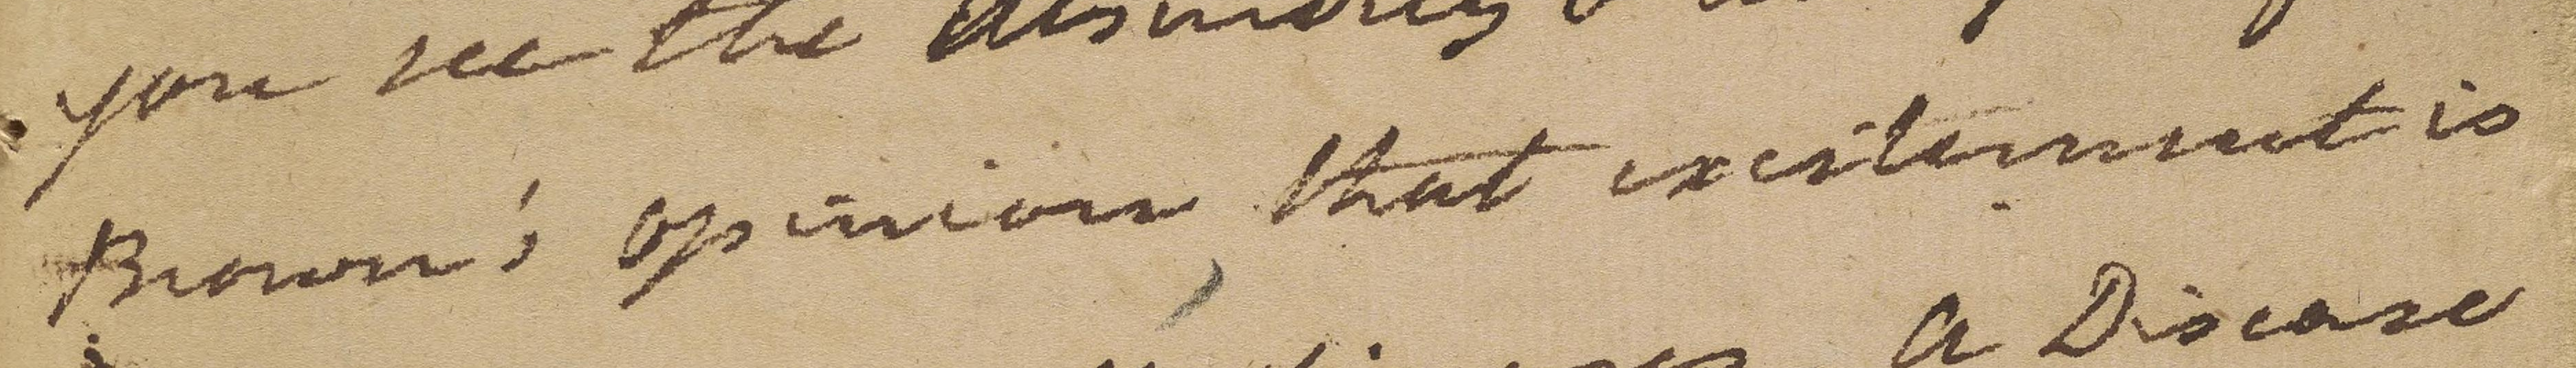Brown's opinion that excitement is
